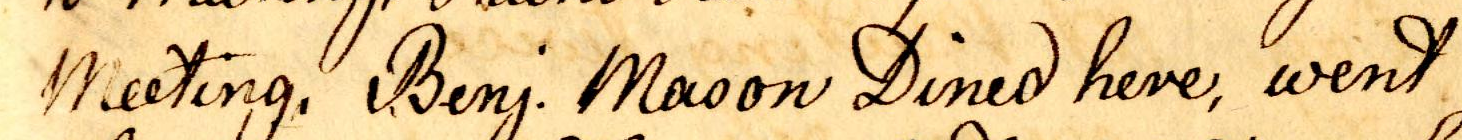Meeting, Benj. Mason Dined here, went
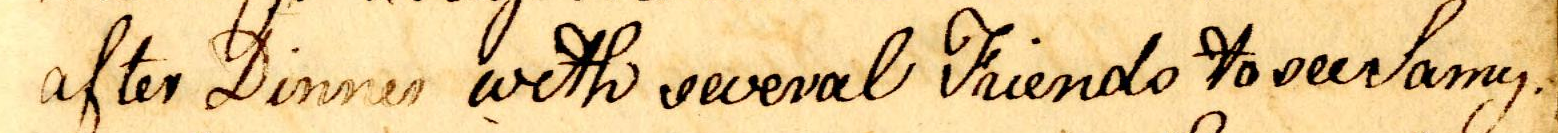after Dinner with several Friends to see Samy
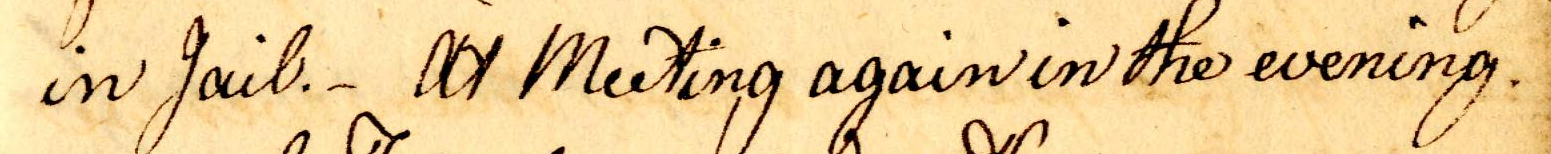in Jail. - At Meeting again in the evening.
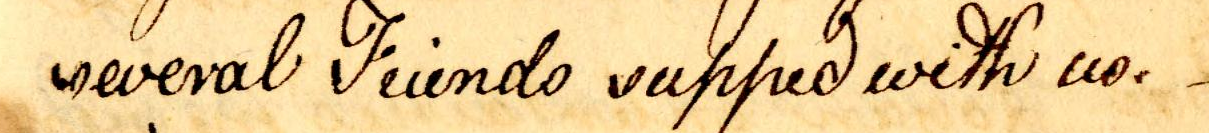several Friends supped with us.
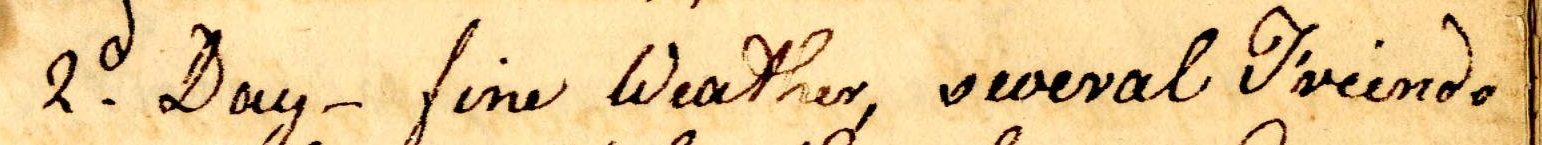2^d. Day- fine Weather, several Friends
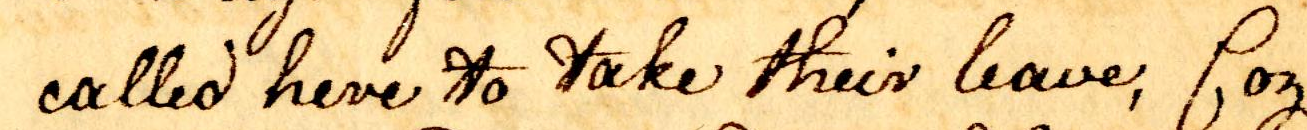called here to take their leave, Coz
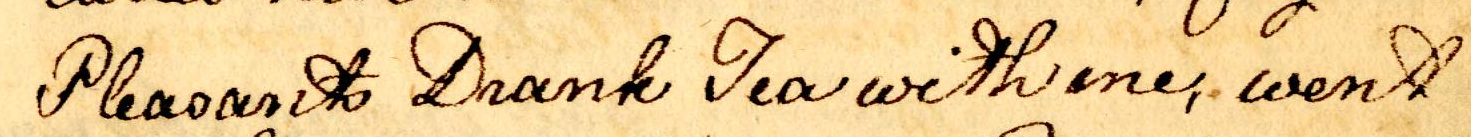Pleasants Drank Tea with me, went
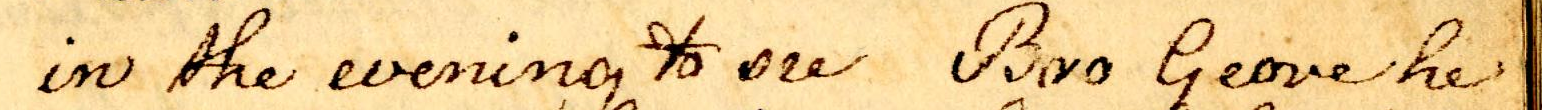in the evening to see Bro Geore he
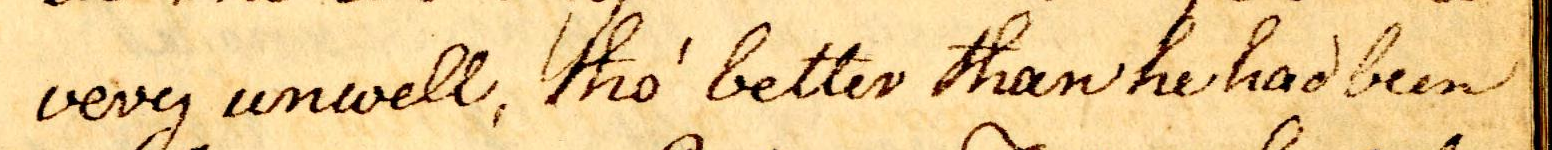very unwell, tho' better than he had been
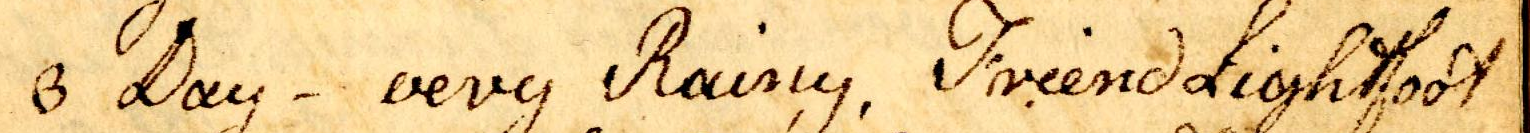3 Day- very Rainy, Friend Lightfoot
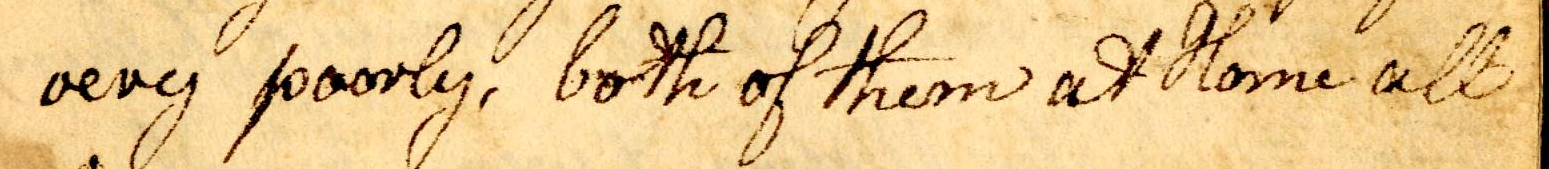very poorly, both of them at Home all
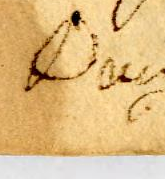Day
